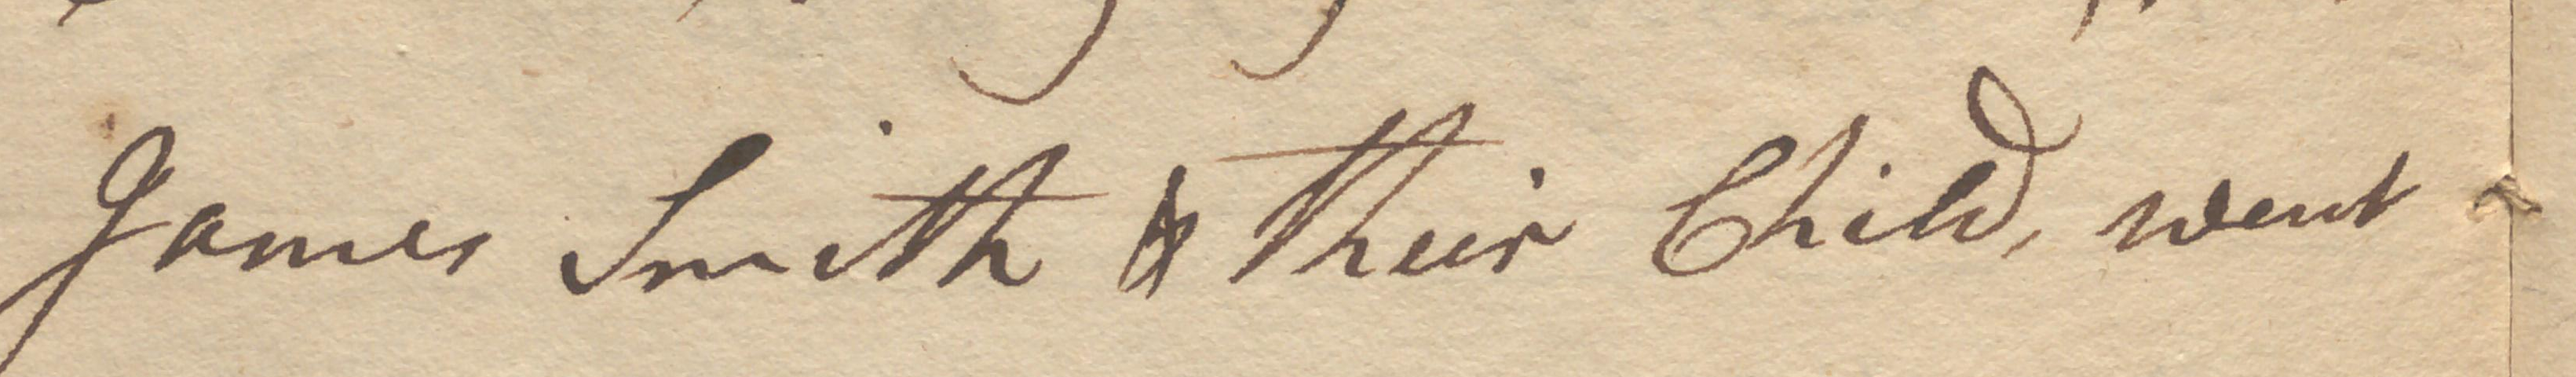James Smith & their Child, went
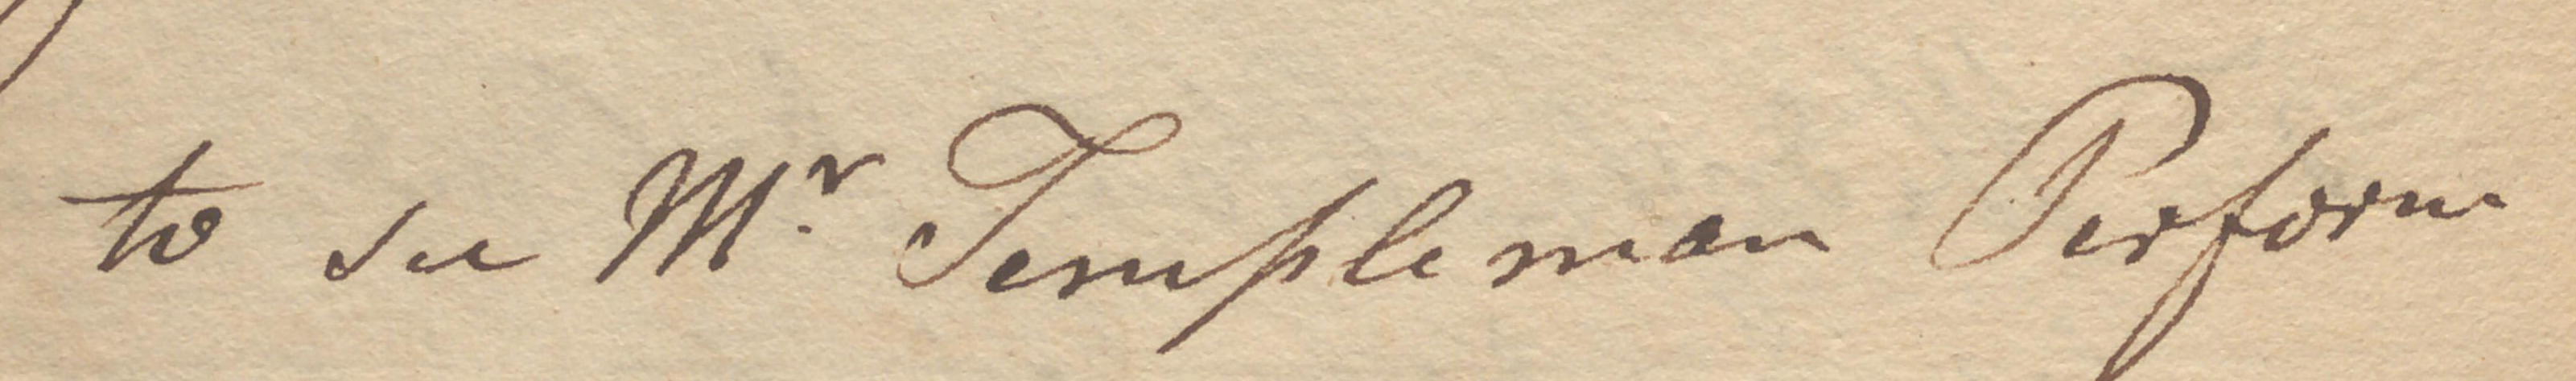to see M^r. Templeman Perform
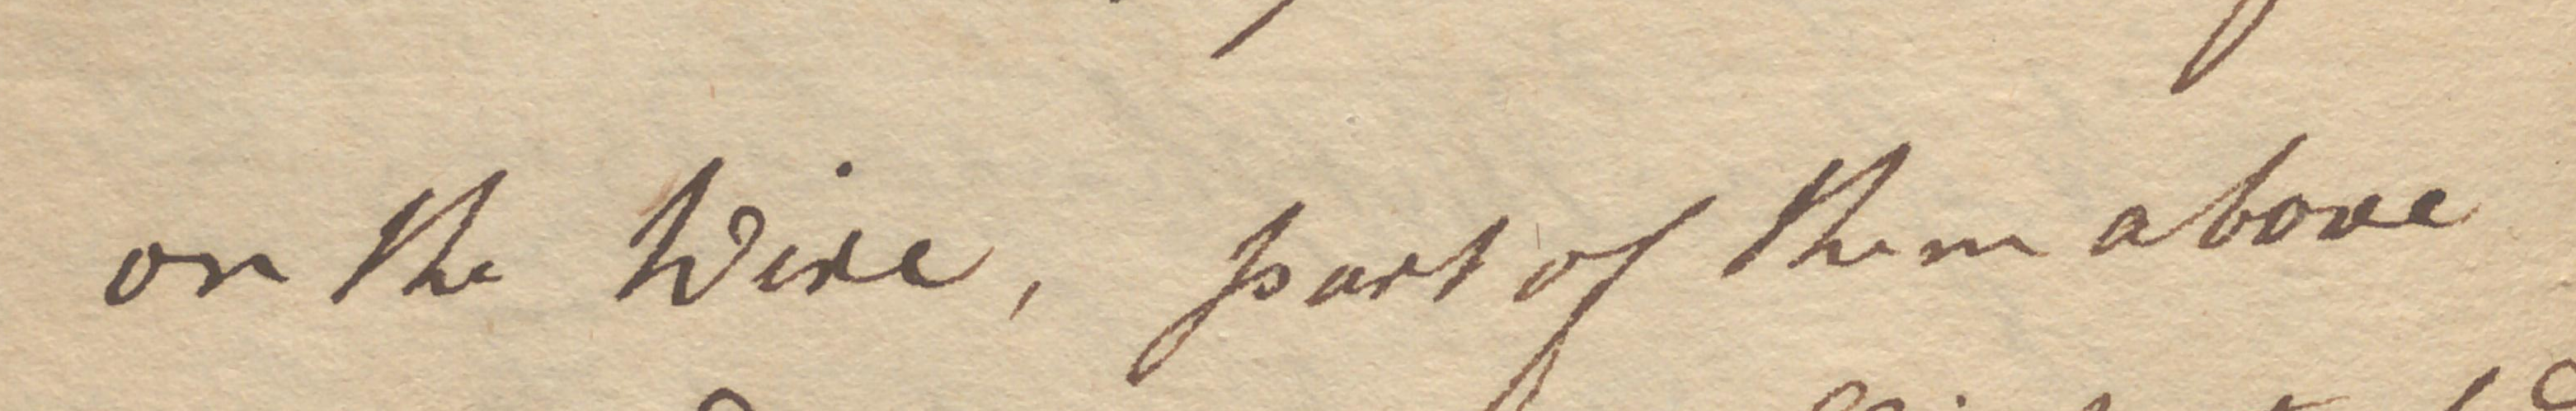on the Wire, part of them above
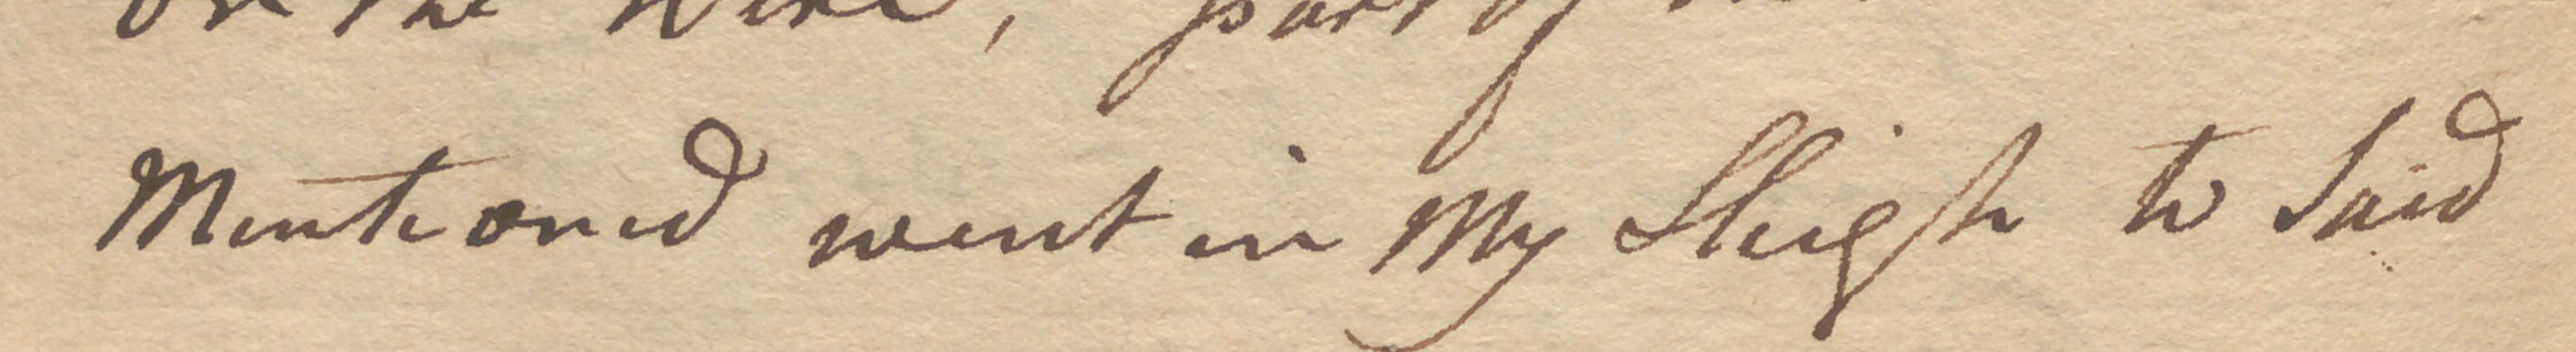Mentioned went in My Sleigh to said
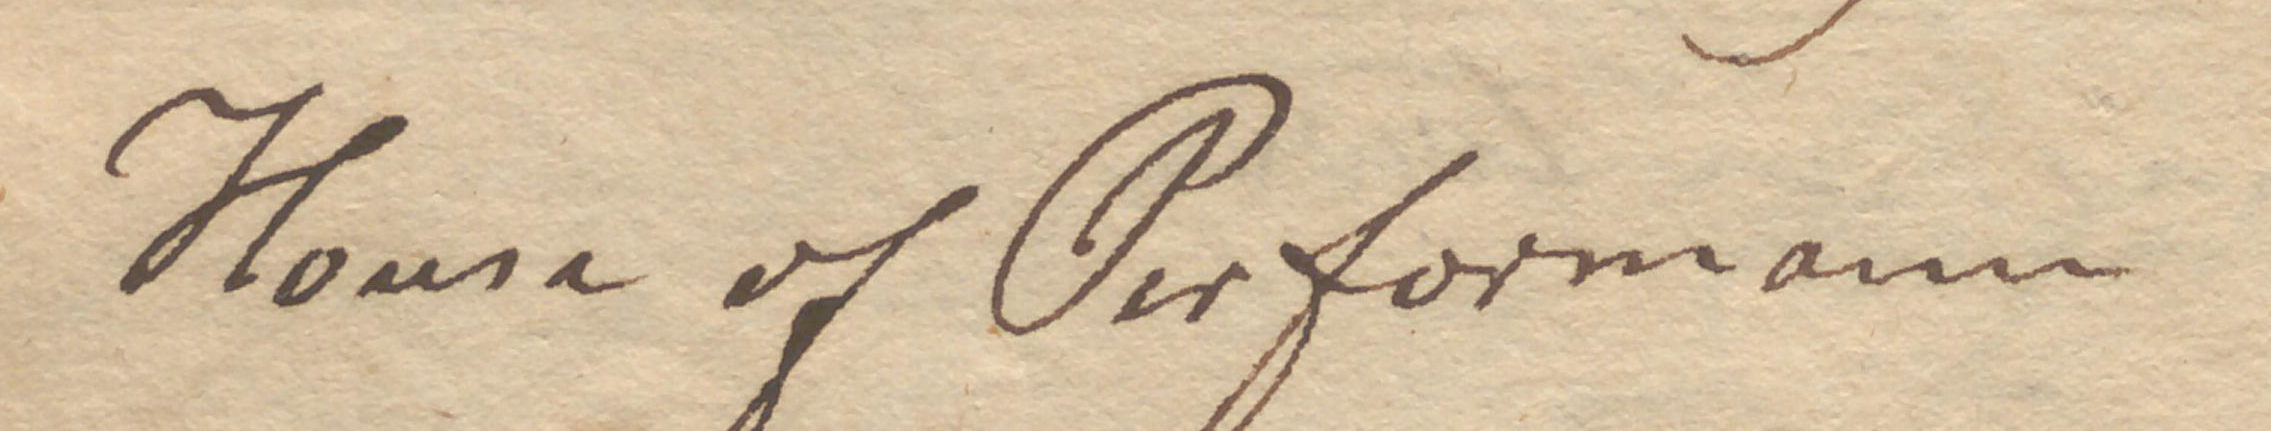House of Performance
